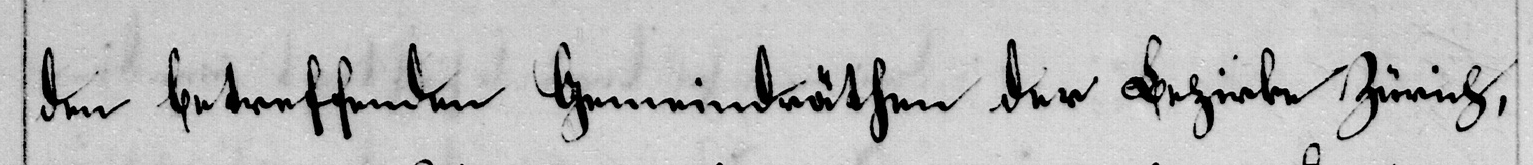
den betreffenden Gemeindräthen der Bezirke Zürich,
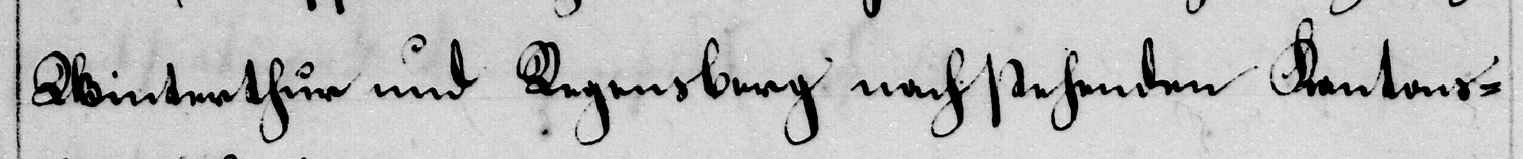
Winterthur und Regensberg nachstehenden Kantons-
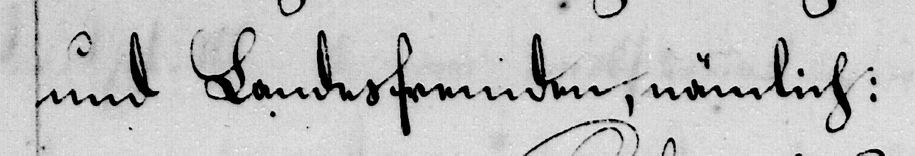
und Landesfremden, nämlich:
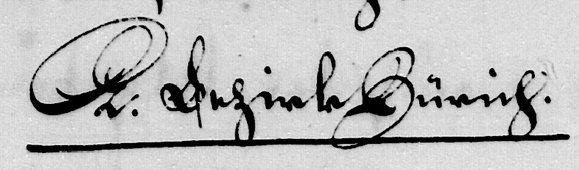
A. Bezirk Zürich.
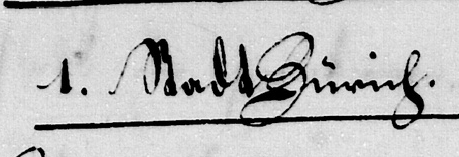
1. Stadt Zürich.
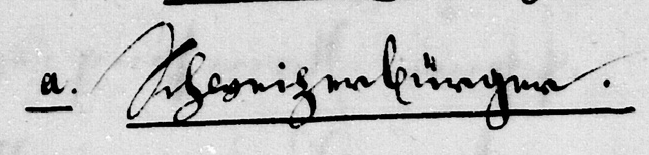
a. Schweizerbürger.
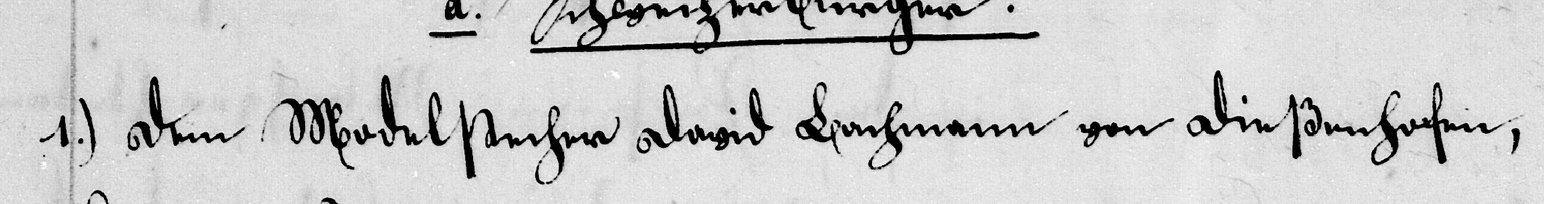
1.) Dem Modelstecher David Bachmann von Dießenhofen,
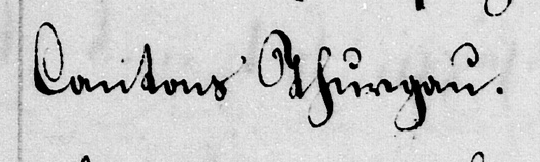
Cantons Thurgau.
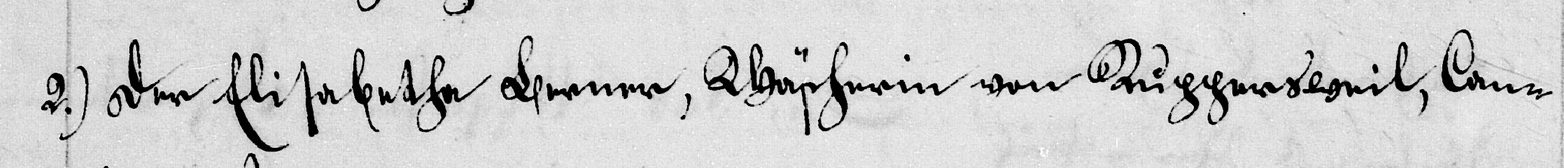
2.) Der Elisabetha Berner, Wäscherin von Ruppersweil, Can¬
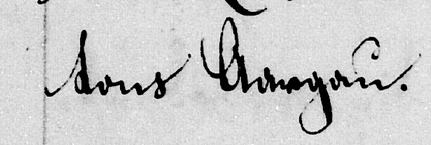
tons Aargau.
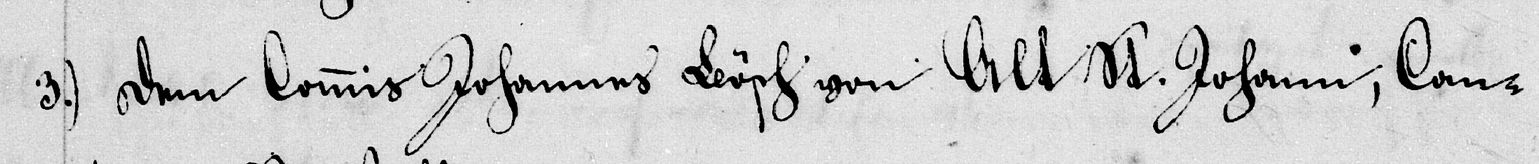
3.) Dem Commis Johannes Bösch von Alt St. Johann, Can¬
